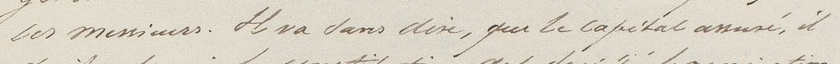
les Messieurs. Il va sans dire, que le capital assuré, il
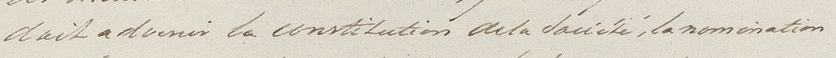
doit advenir la constitution dela Société, la nomination
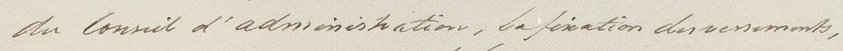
du Conseil d'administration, la fixation des versements,
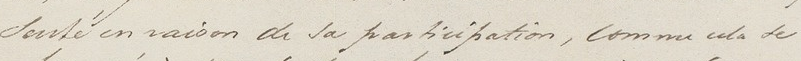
senté en raison de sa participation, comme cela se
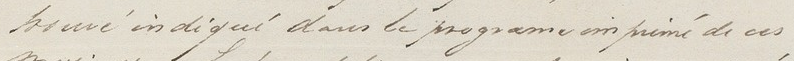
trouvé indiqué dans le programe imprimé de ces
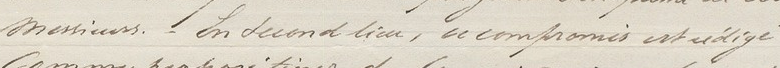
Messieurs. – En second lieu, ce compromis est rédigé
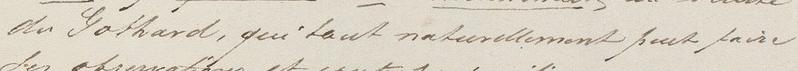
du Gothard, qui tout naturellement peut faire
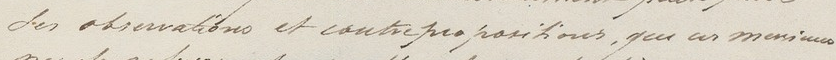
ses observations et contrepropositions, que ces Messieurs
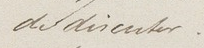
de discuter.
